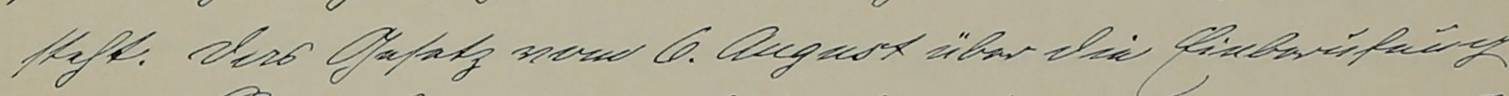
steht. Das Gesetz vom 6. August über die Einberufung
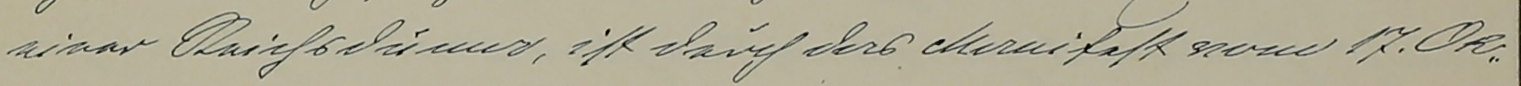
einer Reichsduma, ist durch das Manifest vom 17. Ok-
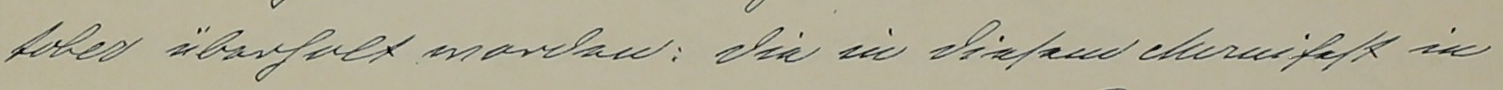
tober überholt worden: die in diesem Manifest in
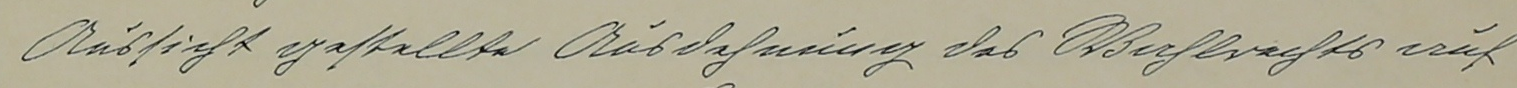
Aussicht gestellte Ausdehnung des Wahlrechts auf
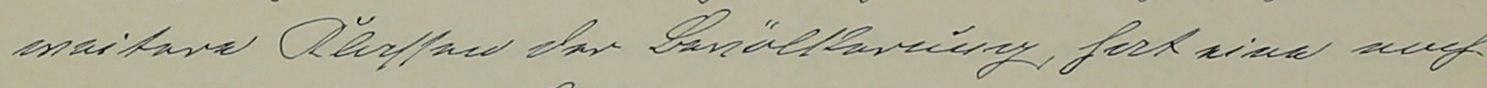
weitere Klassen der Bevölkerung, hat eine noch
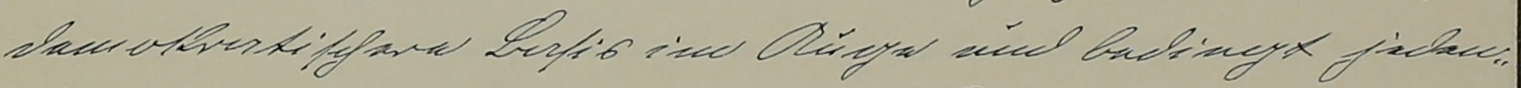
demokratischere Basis im Auge und bedingt jeden-
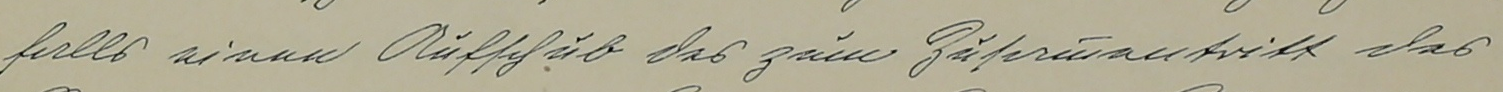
falls einen Aufschub des zum Zusammentritt des
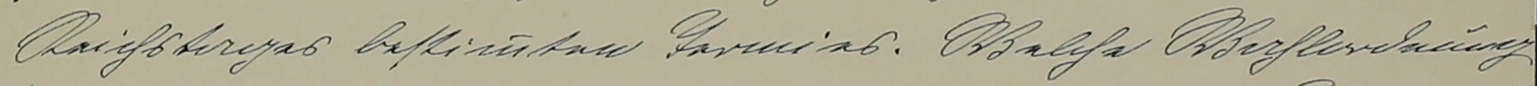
Reichstages bestimmten Termins. Welche Wahlordnung
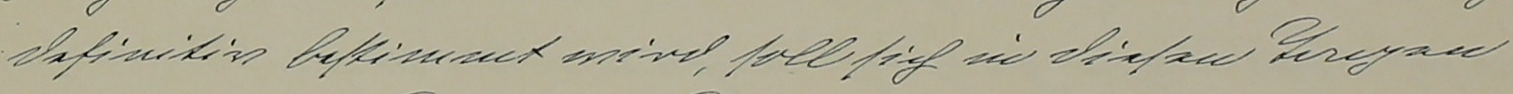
definitiv bestimmt wird, soll sich in diesen Tagen
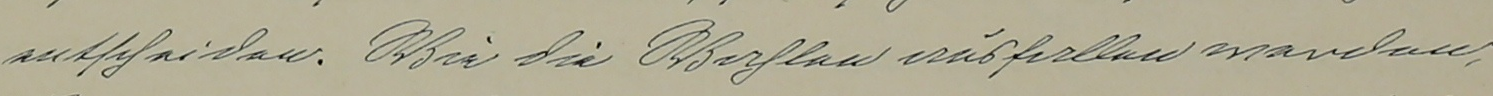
entscheiden. Wie die Wahlen ausfallen werden,
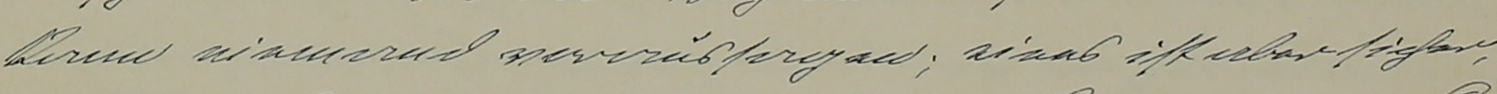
kann niemand voraussagen; eines ist aber sicher,
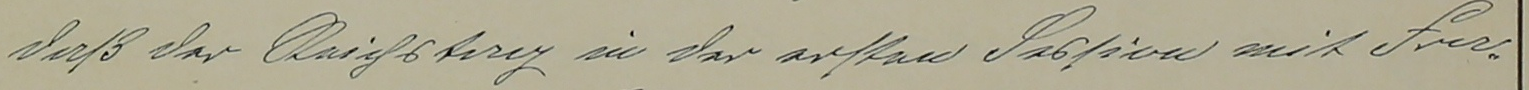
daß der Reichstag in der ersten Session mit Fra-
